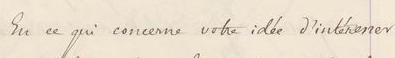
En ce qui concerne votre idée d'intéresser
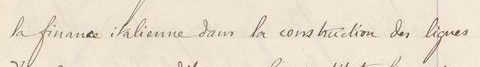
la finance italienne dans la construction des lignes
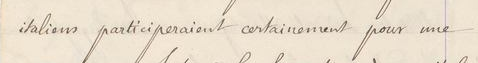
italiens participeraient certainement pour une
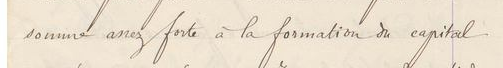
somme assez forte à la formation du capital
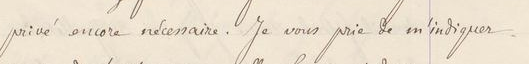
privé encore nécessaire. Je vous prie de m'indiquer
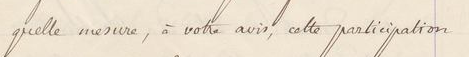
quelle mesure, à votre avis, cette participation
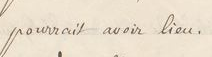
pourrait avoir lieu.
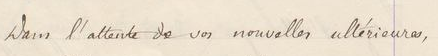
Dans l'attente de vos nouvelles ultérieures,
